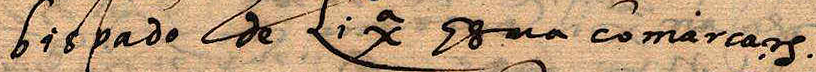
bispado de Lixa E sua cōmarca cꝭ.
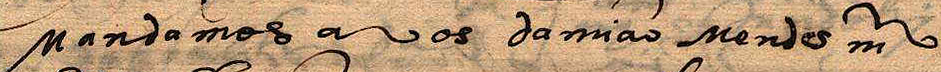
Mandamos a vos damião Mendes m̄ro
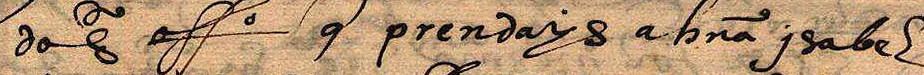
do Sto offo q̄ prendays a huā jsabel
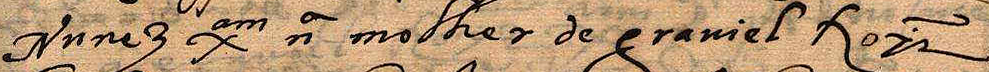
Nunez xam na molher de grauiel Royz̄
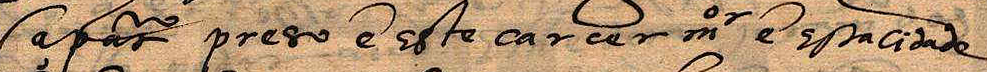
Çapatro preso ē Este carcer mor ē Esta cidade
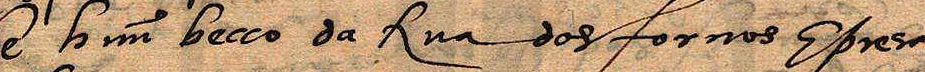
ē hum̄ becco da Rua dos fornos E presa
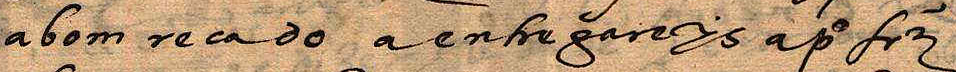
a bom recado a entregareys a po frz̄
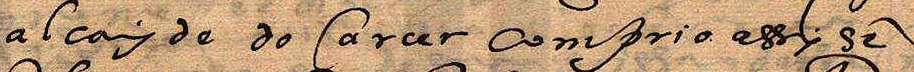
alcayde do Carcer compri o assy sē
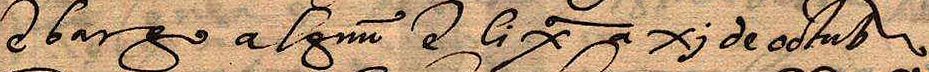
ēbargo alguū ē lixa a xj de octub̄ro
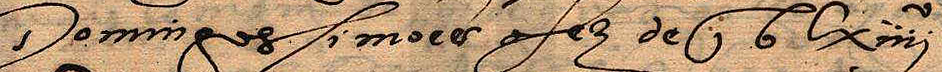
Domingos simoeēs o fez de j̄ blxiiijo
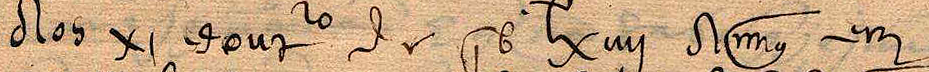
Aos xj doutro de j̄ bclxiiij Annꝯ em
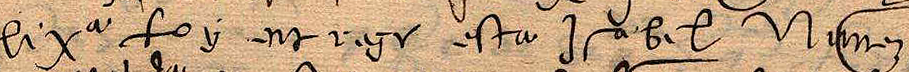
lixa foy entrege esta Jsabel Nunez
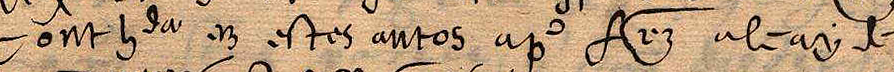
conthda em estes autos a po frz̄ alcayde
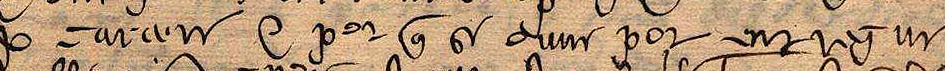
do carcere e porq̄ se ouue por entregue
